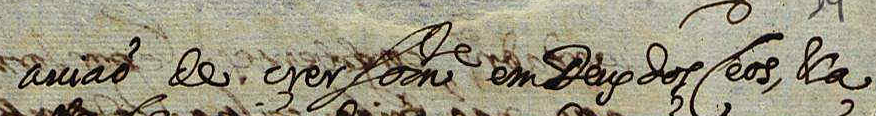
auiaõ de crer somte em Deus dos Ceos, & a
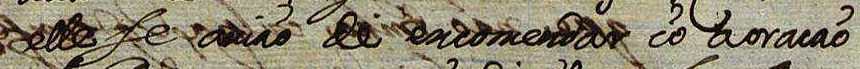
elle se auiaõ de encomendar cō a oraçaõ
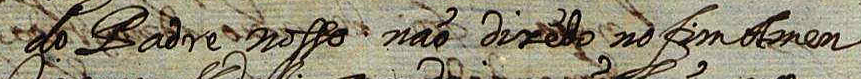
do Padre nosso naõ dizēdo no fim Amen
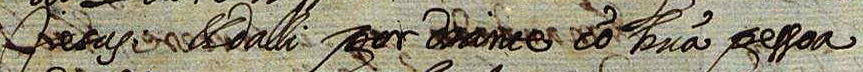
Jesus & dalli por diante cō huã pessoa
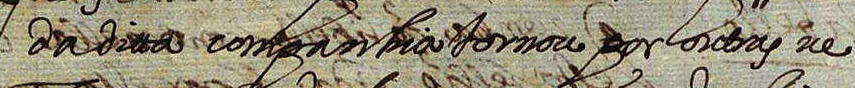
da ditta companhia tornou por outras ue
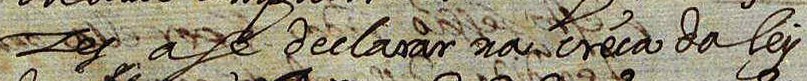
zes a se declarar na crēça da ley
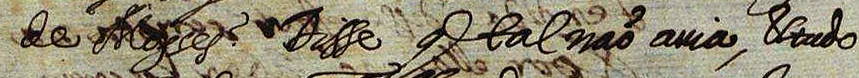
de Moyses? Disse q̄ tal naõ auia, & tudo
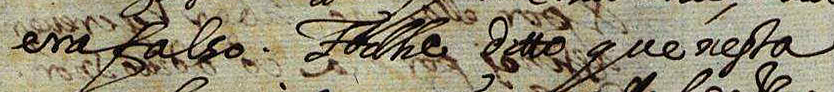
era falso. Foilhe ditto que nesta
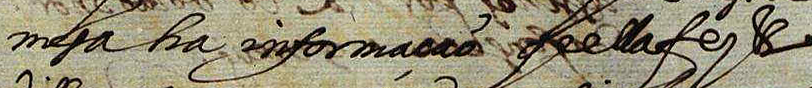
mesa ha informaçaõ q̄ ella fez &
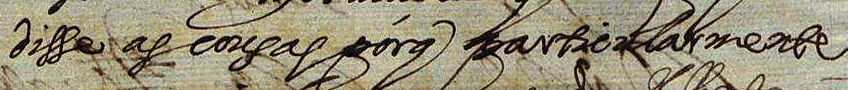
disse as cousas porq̄ particularmente
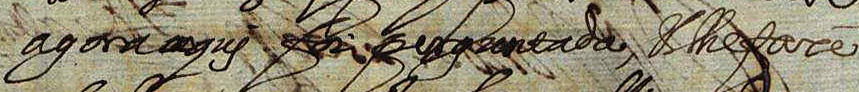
agora aquj foi perguntada, & lhe fazē
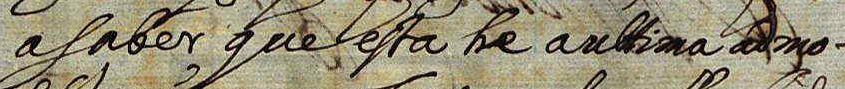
a saber que esta he a ultima admo
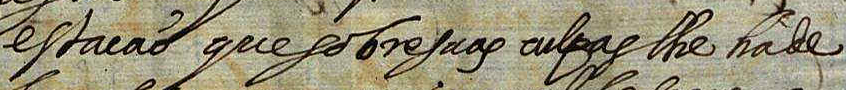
estaçaõ que sobre suas culpas lhe hade
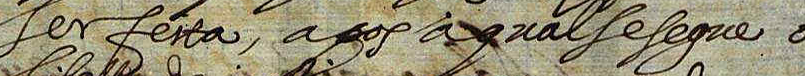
ser feita, apos a qual se segue o
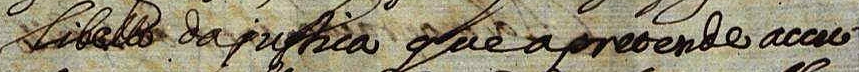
libello da justiça que a pretende accu
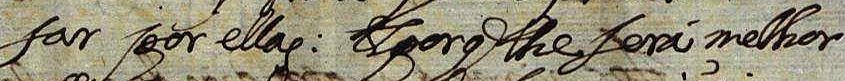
sar por ellas: E porq̄ lhe será melhor
